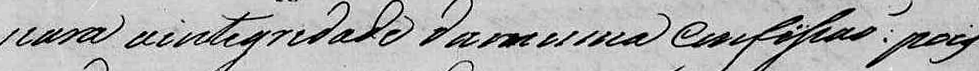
para a integredade da mesma confissaõ. pois
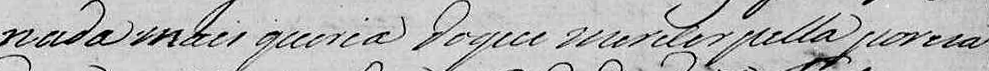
nada mais queria do que merecer pella poresa
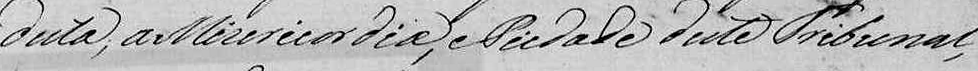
desta, a Misericordia, e Piedade deste Tribunal,
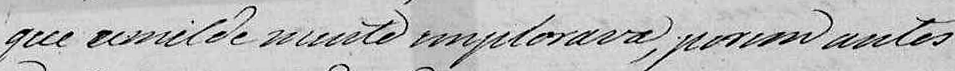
que umildemente implorava, porem antes
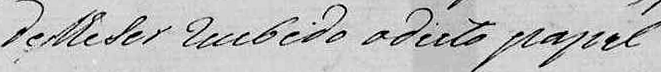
de lhe ser recebido o dicto papel.
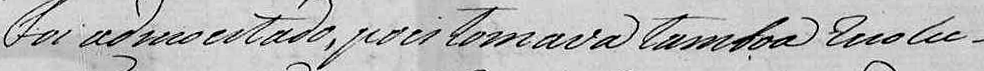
Foi admoestado, pois tomava tam boa resolu
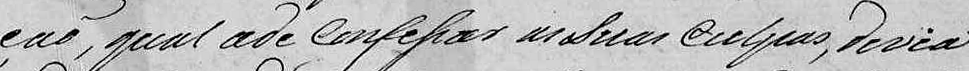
çaõ, qual a de confessar as suas culpas, devia
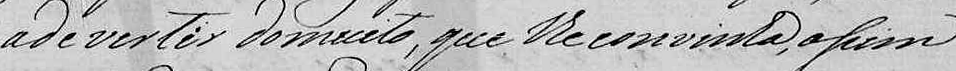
adevertir do muito, que lhe convinha, assim
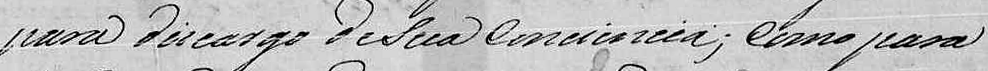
para descargo de sua conciencia; como para
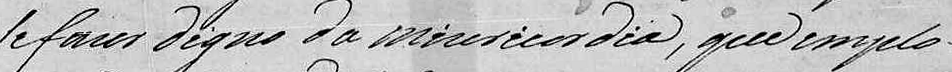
se faser digno da misericordia, que amplo
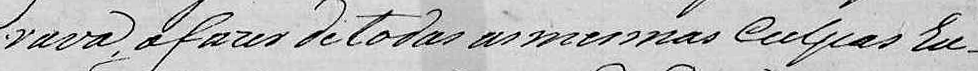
rava, a fazer de todas as mesmas culpas hu
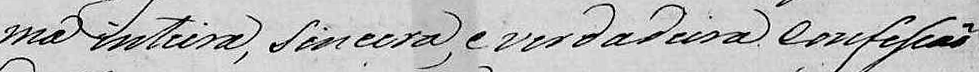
ma inteira, sincera, e verdadeira confessaõ
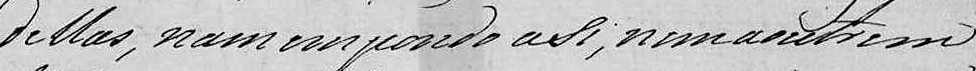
dellas, nam empondo a si, nem a outrem,
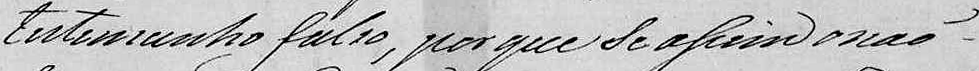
testemunho falso, por que se assim o naõ
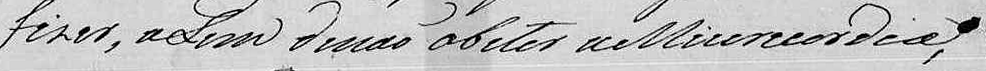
fizer, alem dessas obeter a Miserecordia,
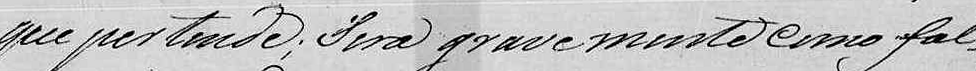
que pertende; sera gravemente como fal
